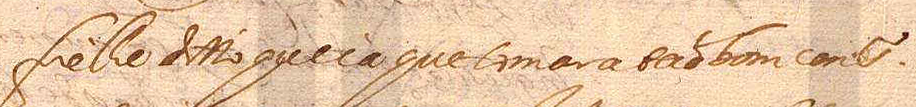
foilhe ditto que ia que tomara taõ bom conso
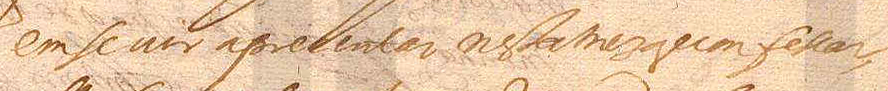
em se uir aprecentar nesta meza e confessar,
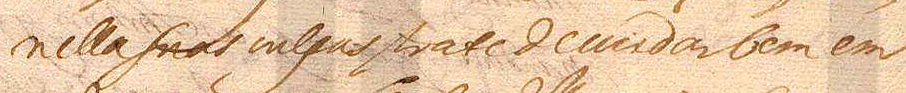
nella suas culpas trate de cuidar bem em
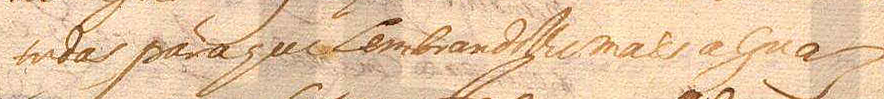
todas para que lembrandolhe mais alguā
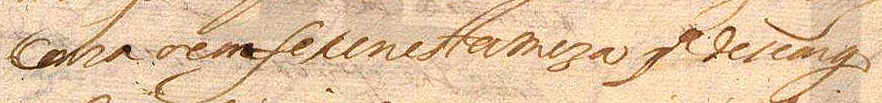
couza o confesse nesta meza pa descargo
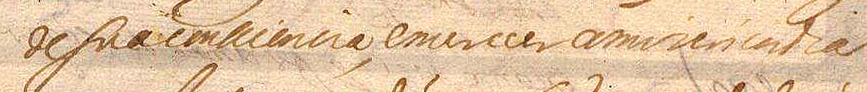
de sua consciencia, e merecer a mizericordia
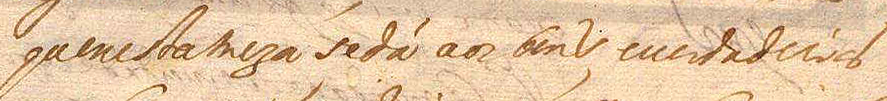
que nesta meza se dá aos bons e uerdadeiros
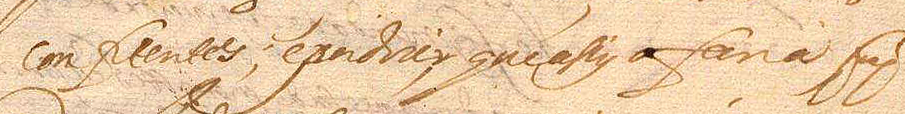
confitentes; e por dizer que assy o faria foy
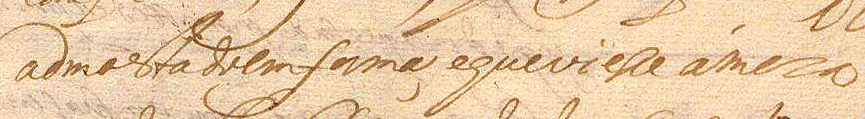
admoestado em forma, e que viesse a meza
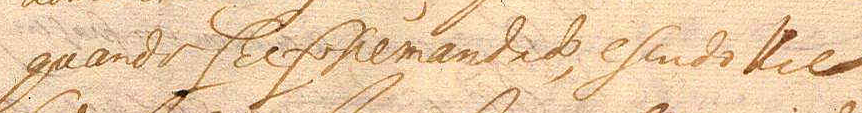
quando lhe fosse mandado, e sendo lhe
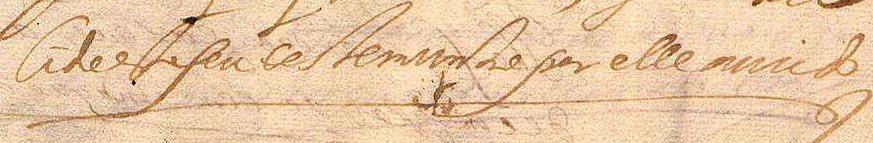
lido este seu testemuho por elle ouuido
